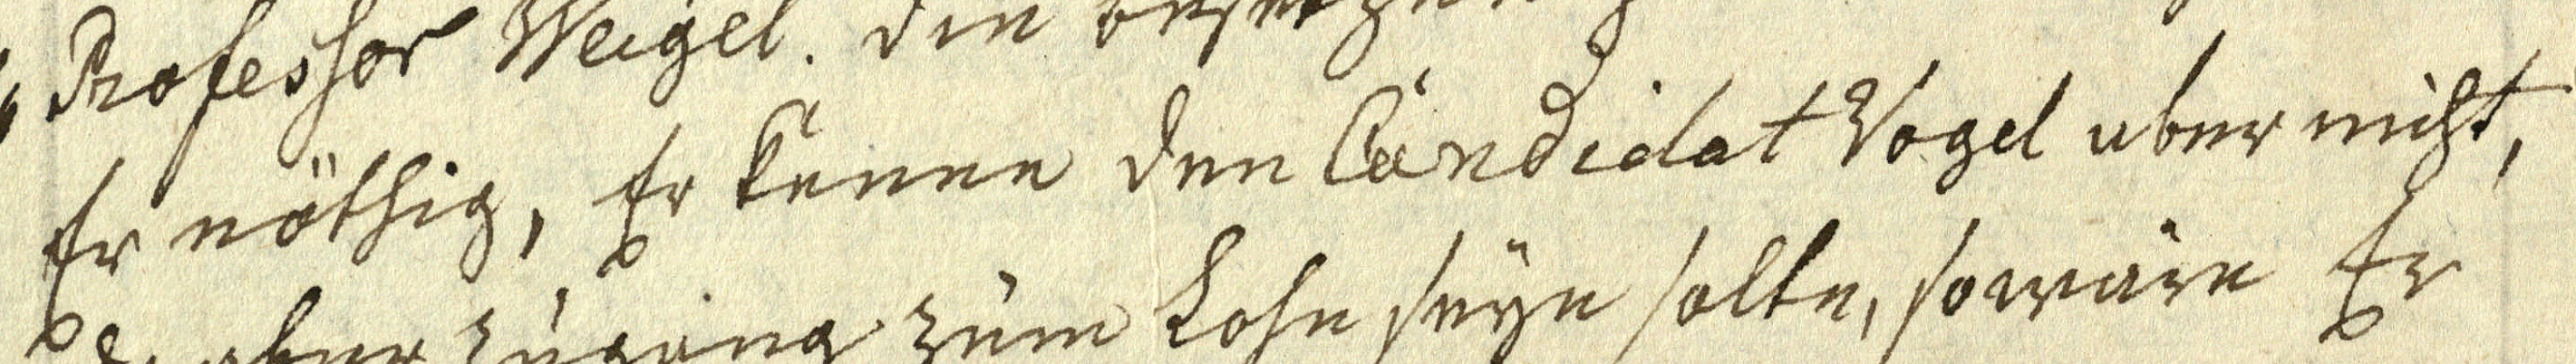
Er nöthig, Er kenne den Candidat Vogel aber nicht,
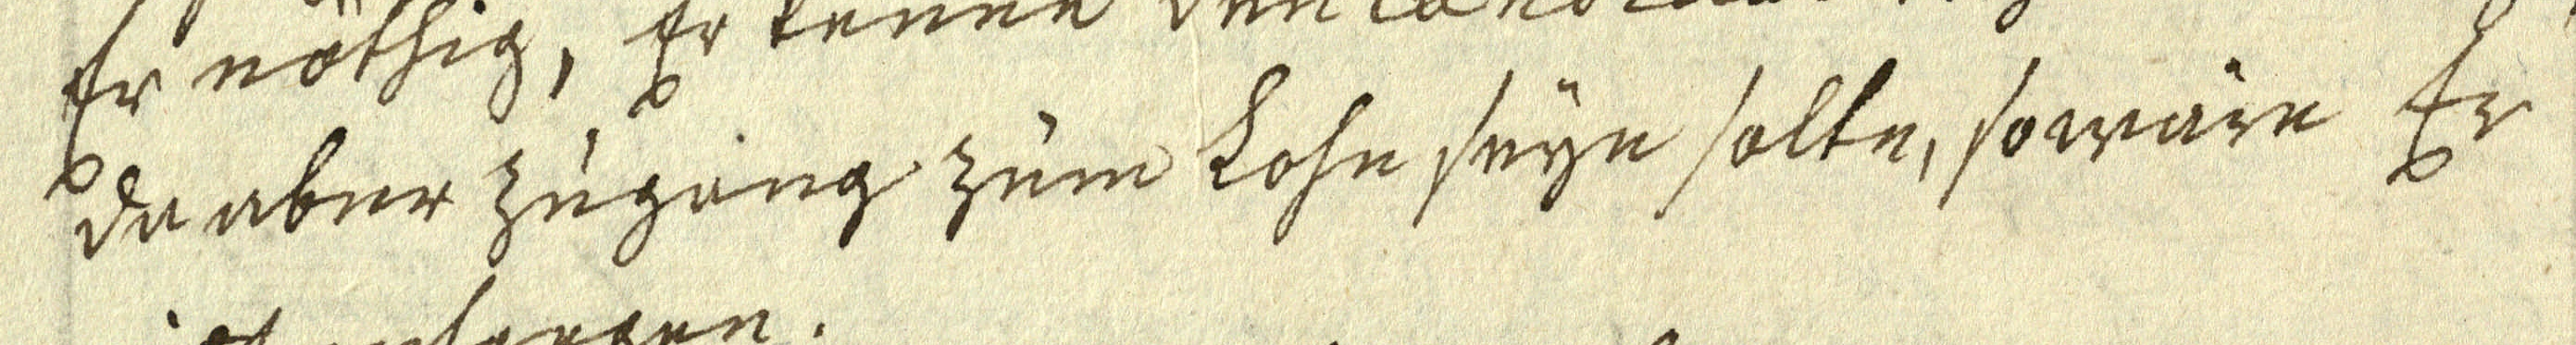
da aber Zugang zum Lohn seÿn solte, so wäre Er
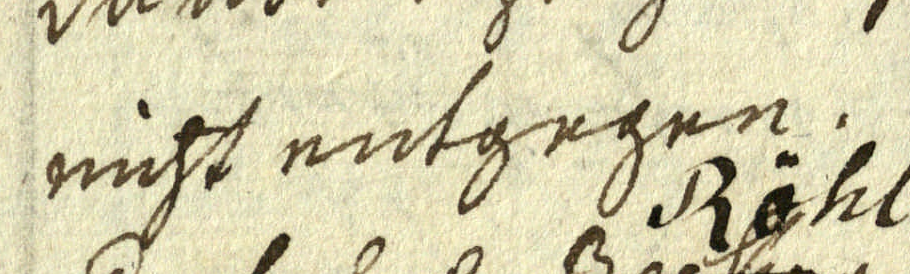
nicht entgegen.
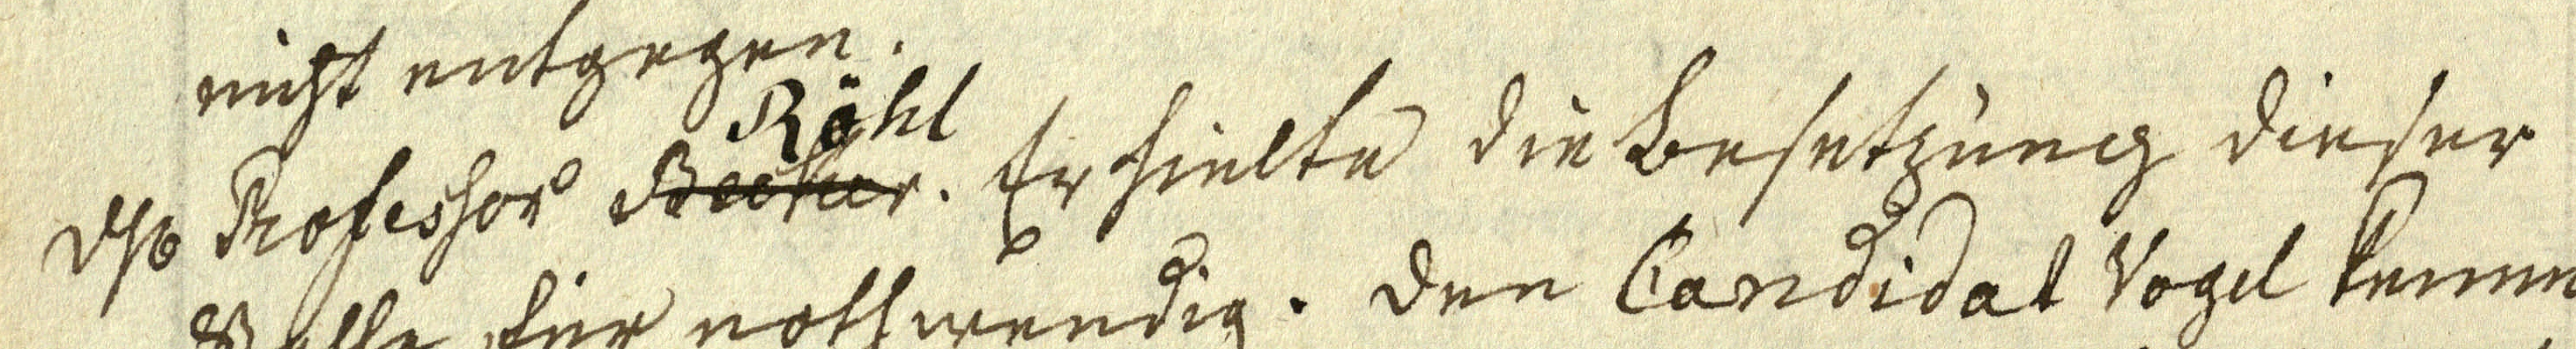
dh Professor Becker. Er hielte die Besetzung dieser
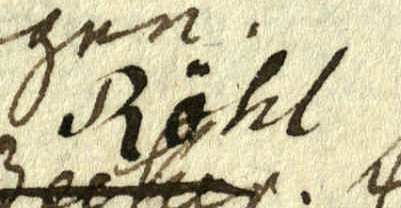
Röhl
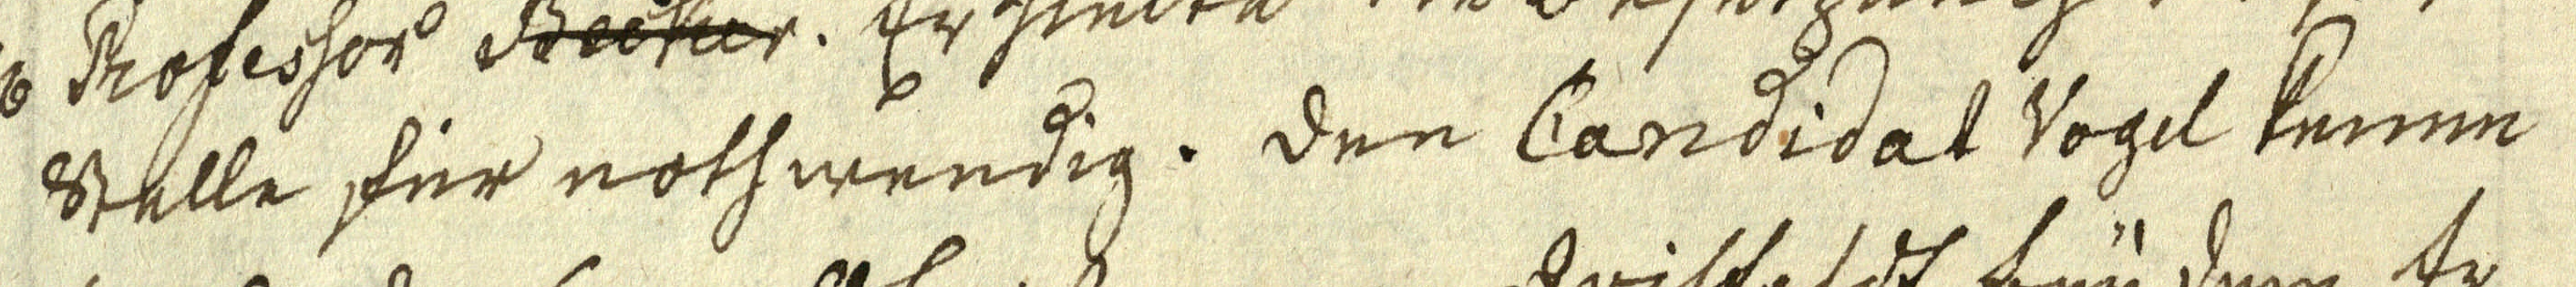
Stelle für nothwendig. Den Candidat Vogel kenne
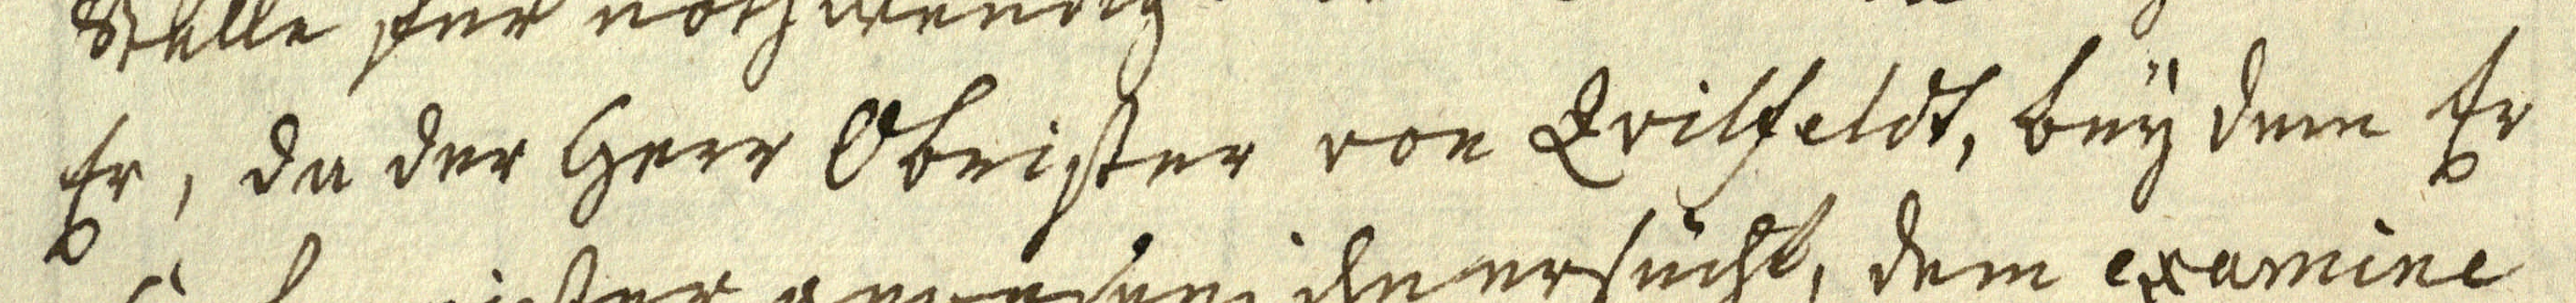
Er, da der Herr Obrister von Quilfeldt, beÿ dem Er
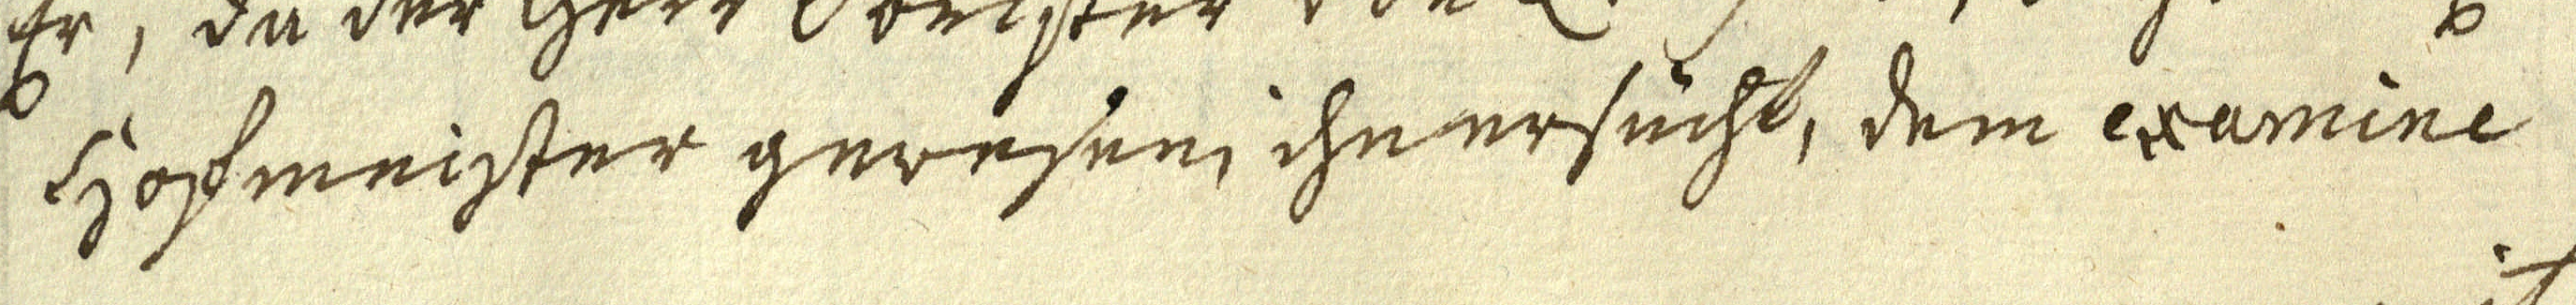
Hofmeister gewesen, ihn ersucht, dem examine
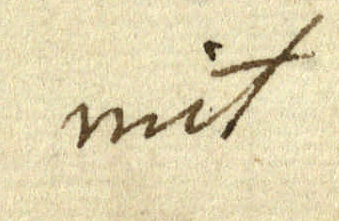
mit
